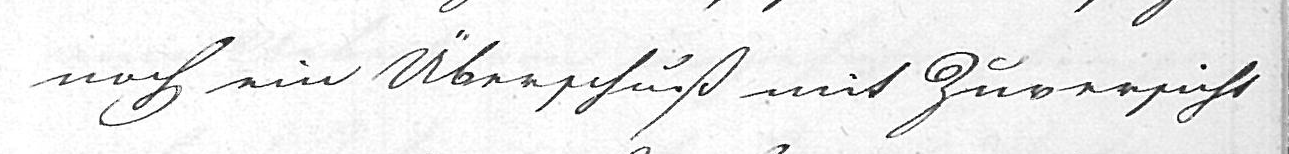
noch ein Überschuß mit Zuversicht
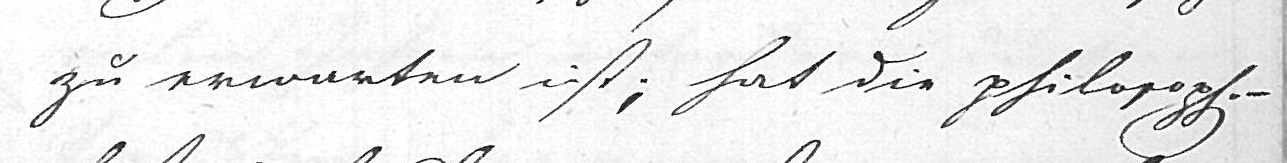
zu erwarten ist; hat die philosoph.-
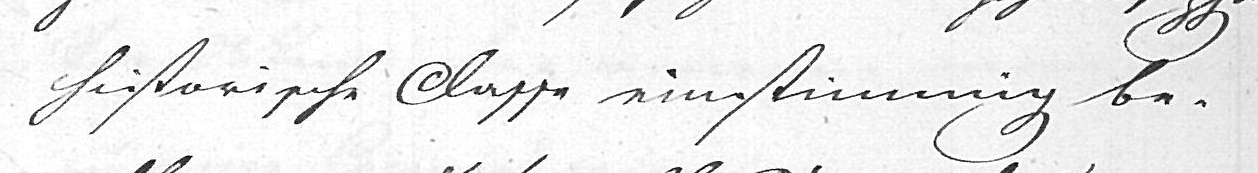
historische Classe einstimmig be-
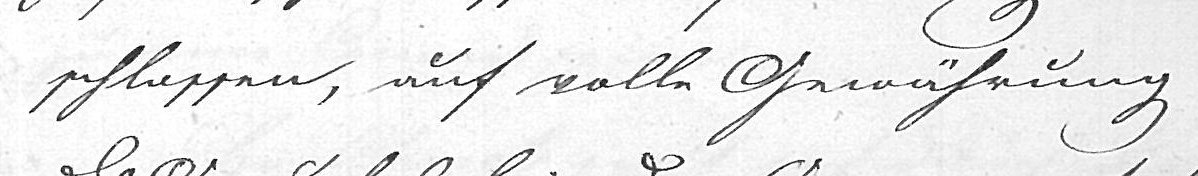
schlossen, auf volle Gewährung
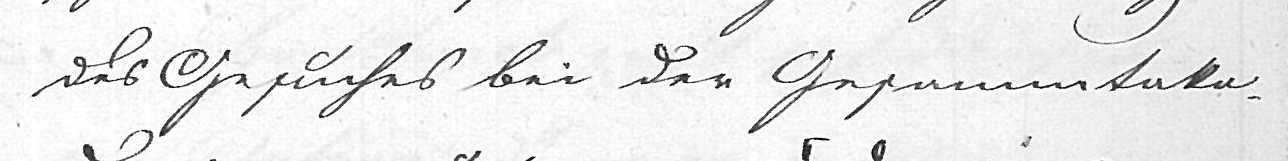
des Gesuches bei der Gesamtaka-
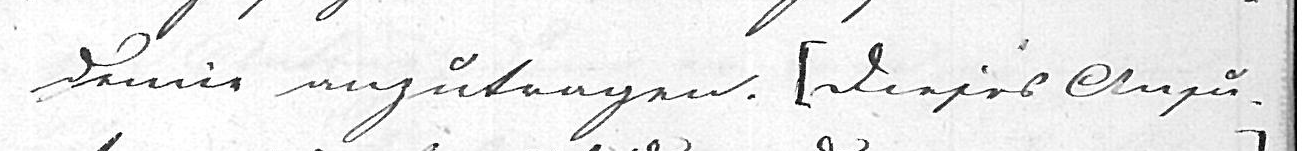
demie anzutragen. [Dieses Ansu-
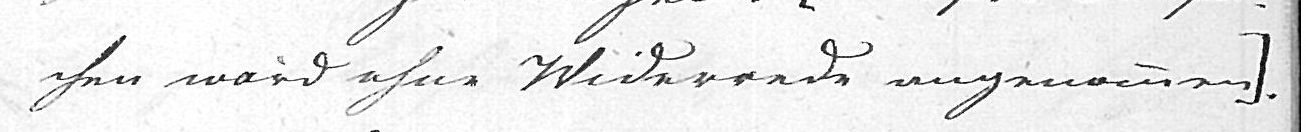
chen wird ohne Widerrede angenommen.].
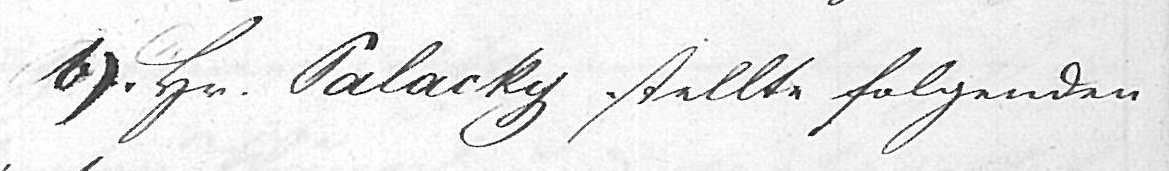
b). Hr. Palacky stellte folgenden
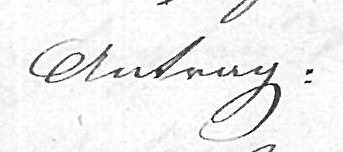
Antrag:
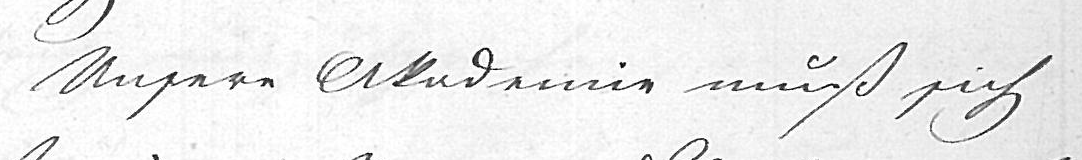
Unsere Akademie muß sich
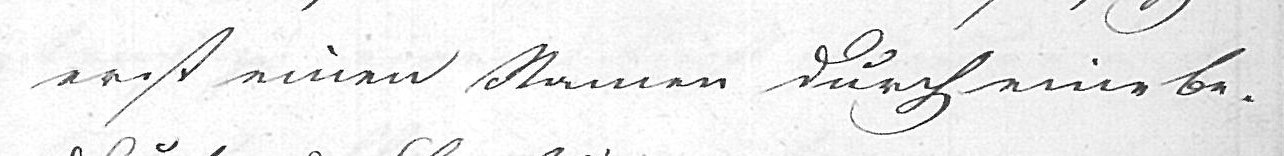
erst einen Namen durch eine be-
